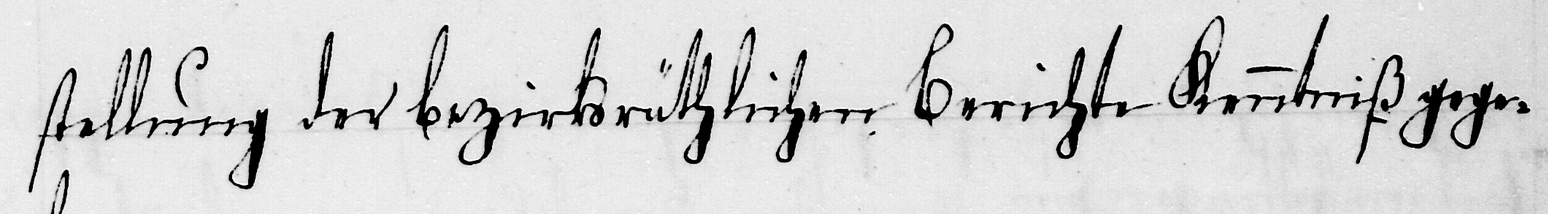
stellung der bezirksräthlichen Berichte Kenntniß gege¬
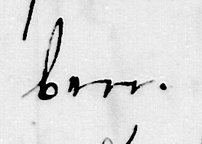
ben.
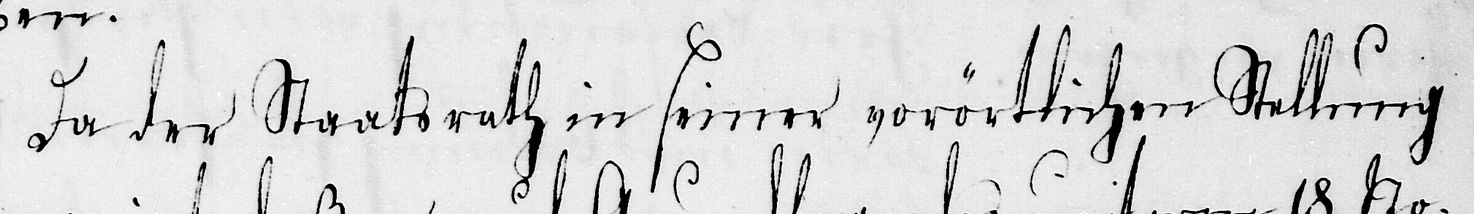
Da der Staatsrath in seiner vorörtlichen Stellung
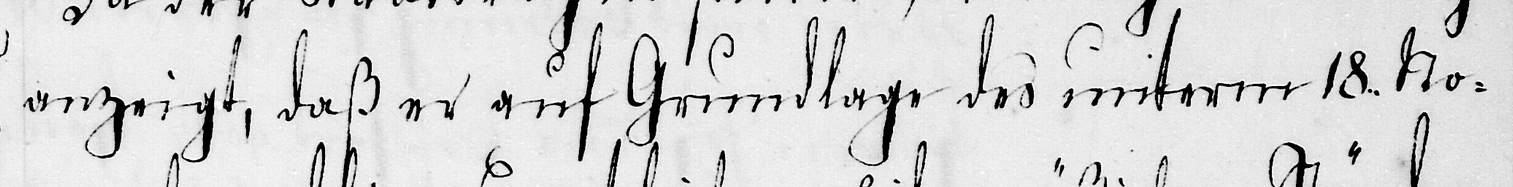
anzeigt, daß er auf Grundlage des unterm 18. No¬
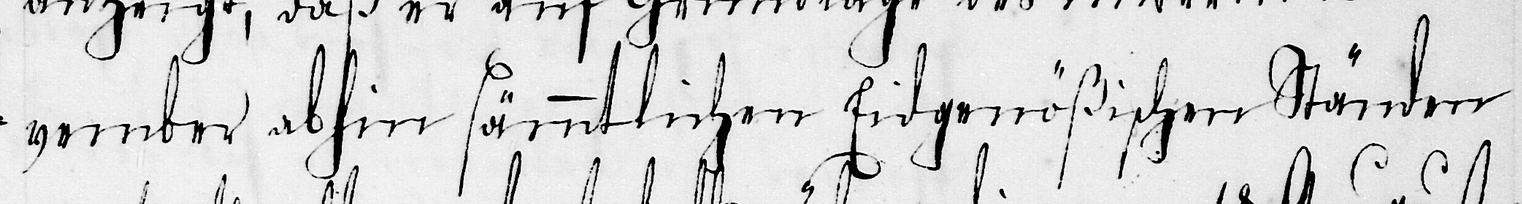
vember abhin sämmtlichen Eidgenößischen Ständen
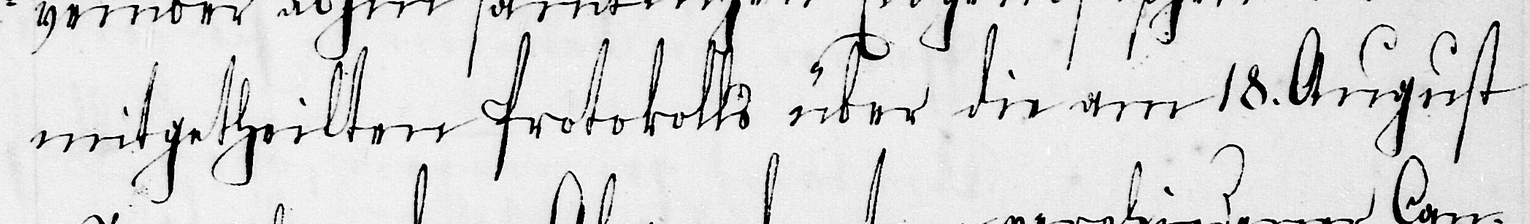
mitgetheilten Protokolls über die am 18. August
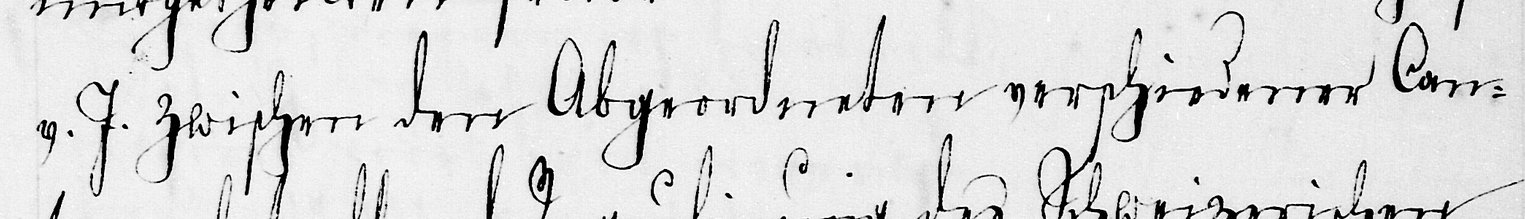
v. J. zwischen den Abgeordneten verschiedener Can¬
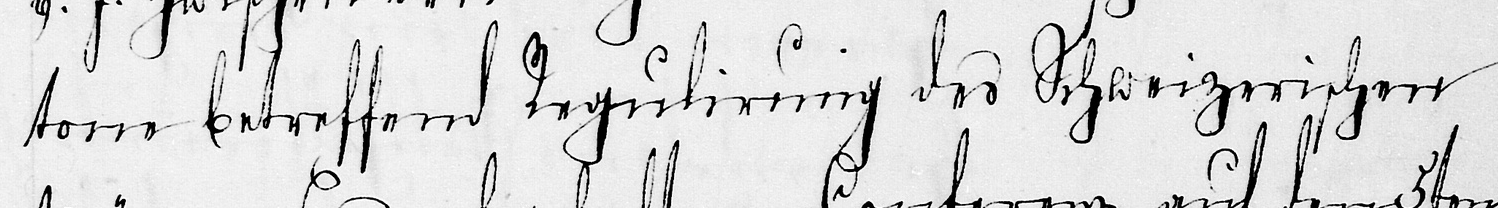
tone betreffend Regulirung des Schweizerischen
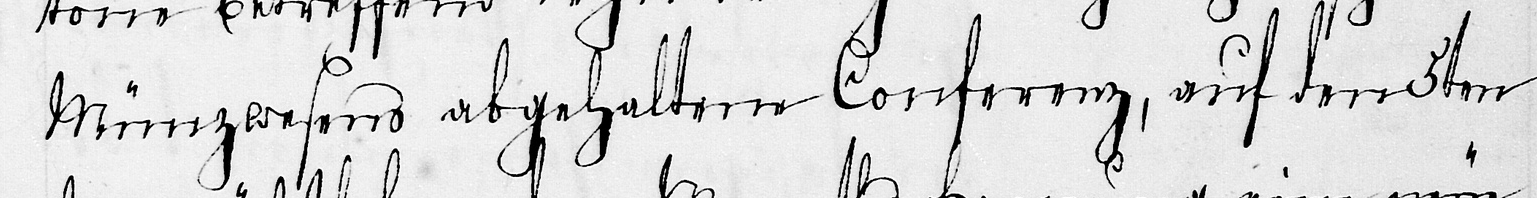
Münzwesens abgehaltene Conferenz, auf den 5ten
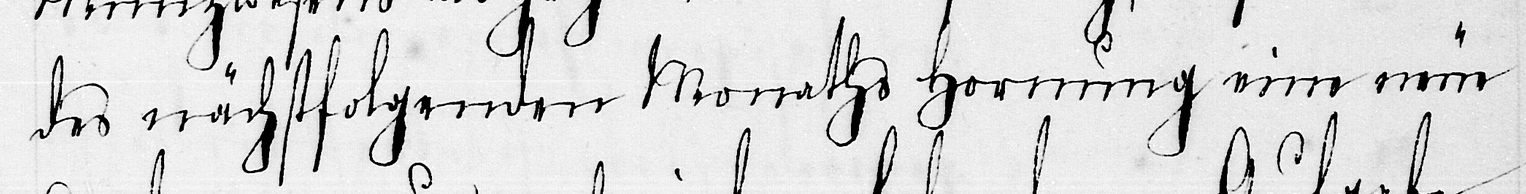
des nächstfolgenden Monaths Hornung eine neue
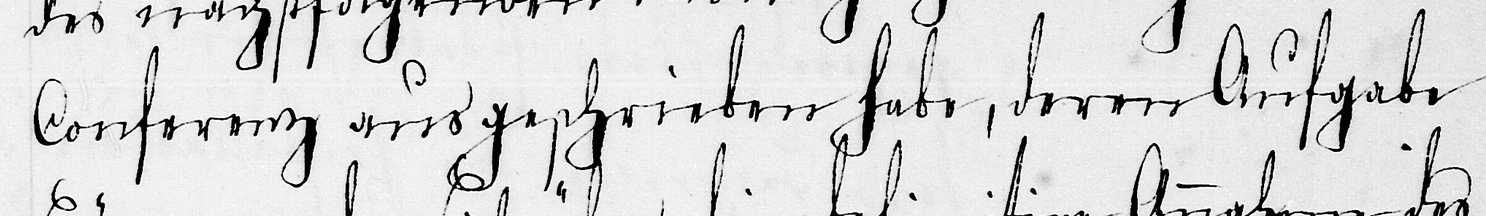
Conferenz ausgeschrieben habe, deren Aufgabe
